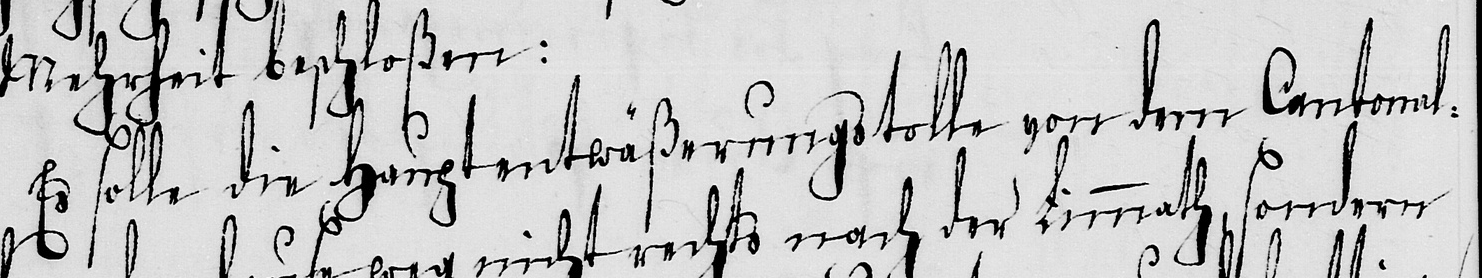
Es solle die Hauptentwäßerungstolle von dem Cantonal¬
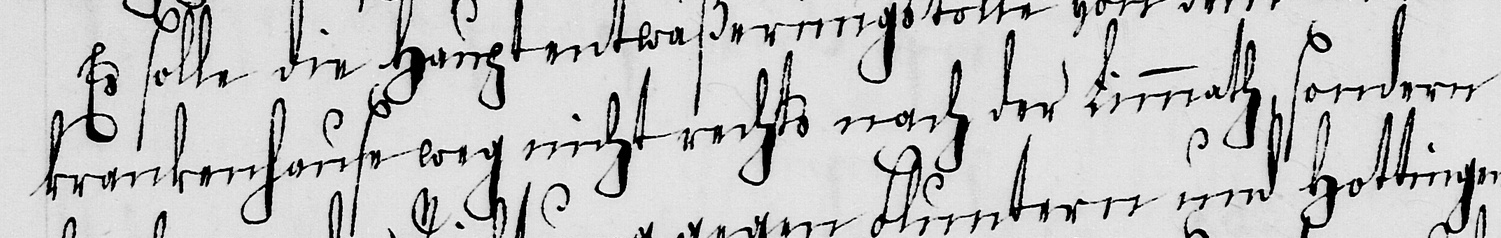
krankenhause weg nicht rechts nach der Limmath, sondern
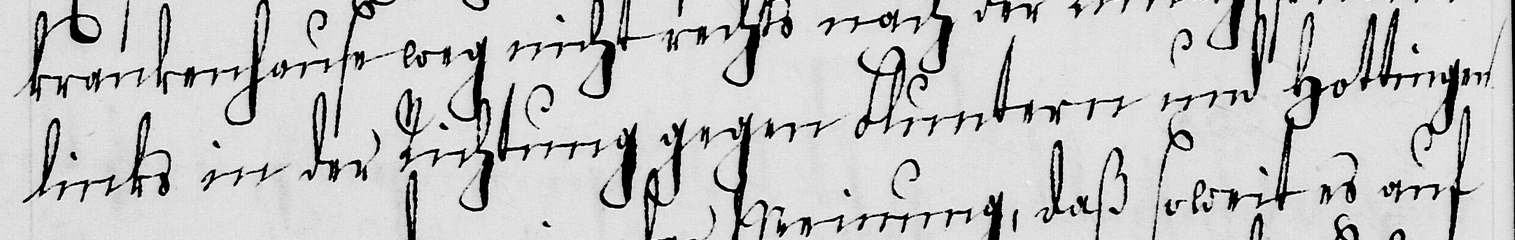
links in der Richtung gegen Fluntern und Hottingen
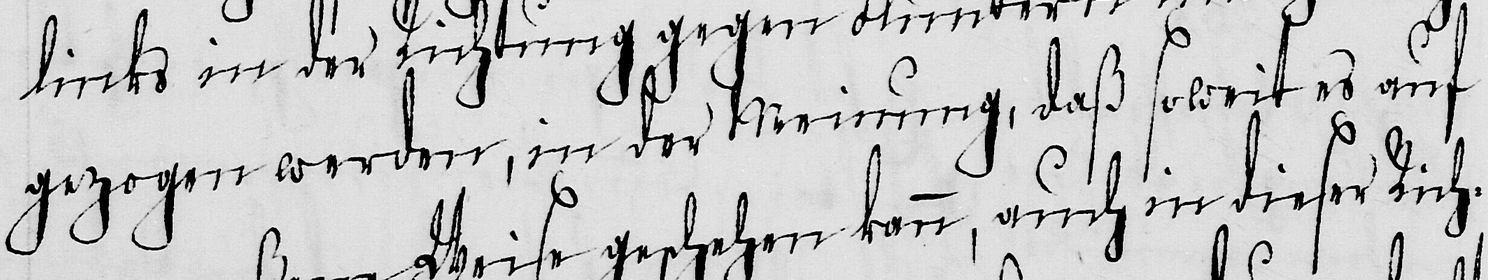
gezogen werden, in der Meinung, daß soweit es auf
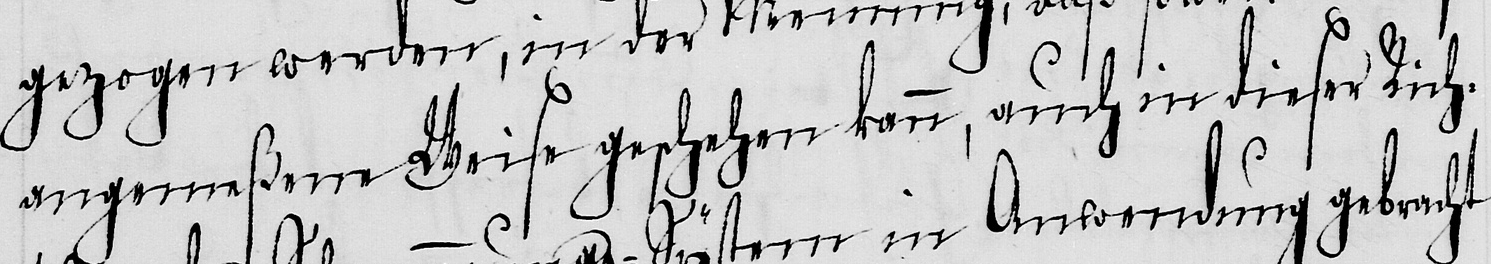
angemeßene Weise geschehen kann, auch in dieser Ric¬
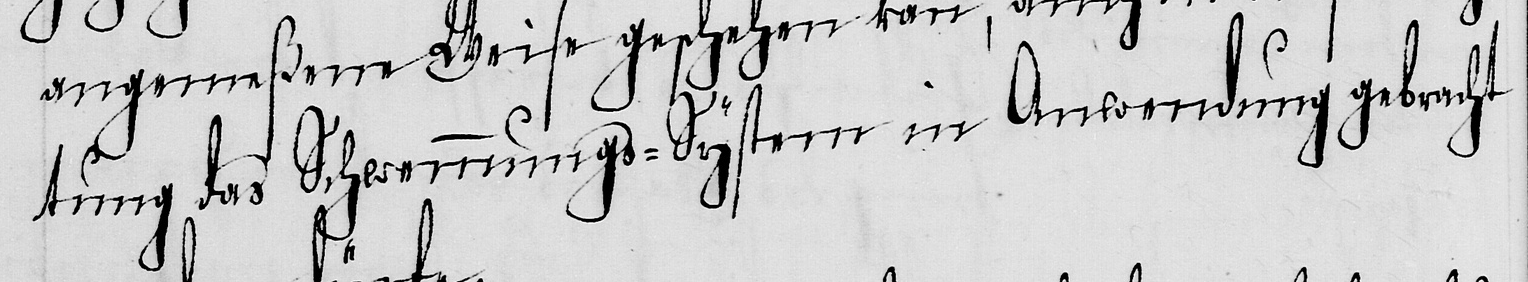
htung das Schwemmungs-System in Anwendung gebracht
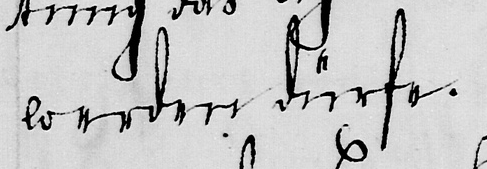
werden dürfe.
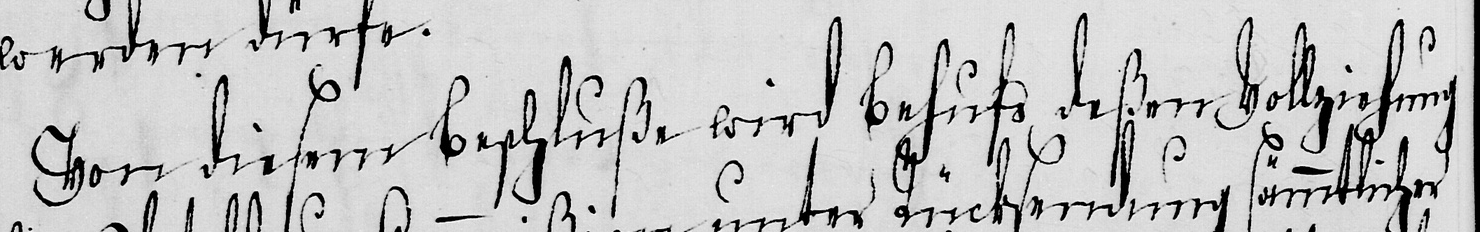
Von diesem Beschluße wird Behufs deßen Vollzieh¬
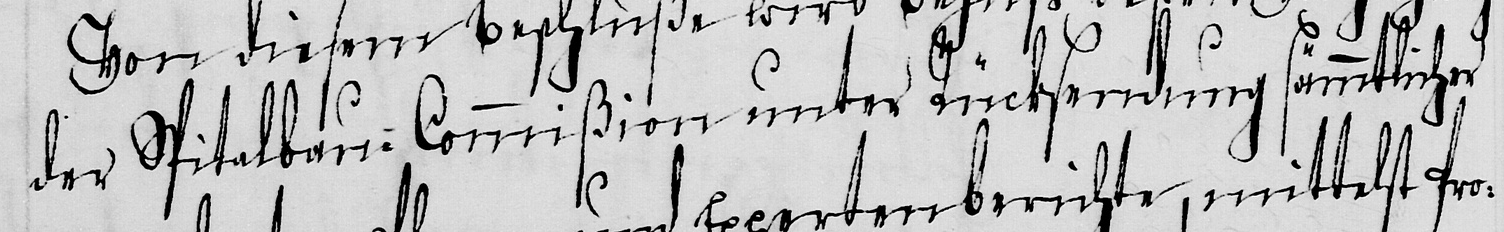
der Spitalbau-Commißion unter Rücksendung sämmtlich¬
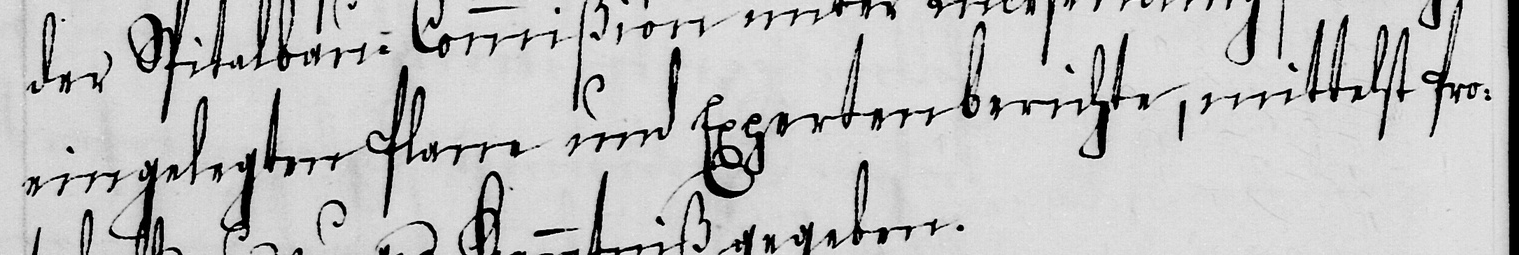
eingelegten Plane und Exeprtenberichte, mittelst Pro¬
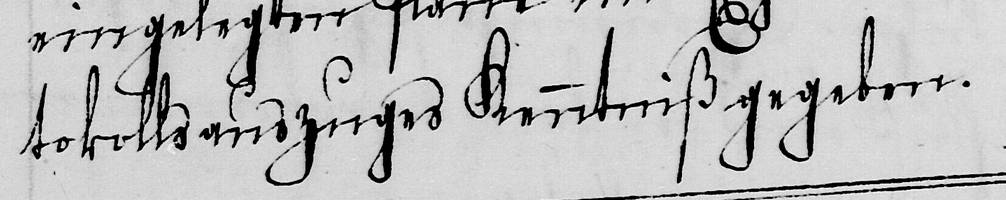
tokollsauszuges Kenntniß gegeben.
